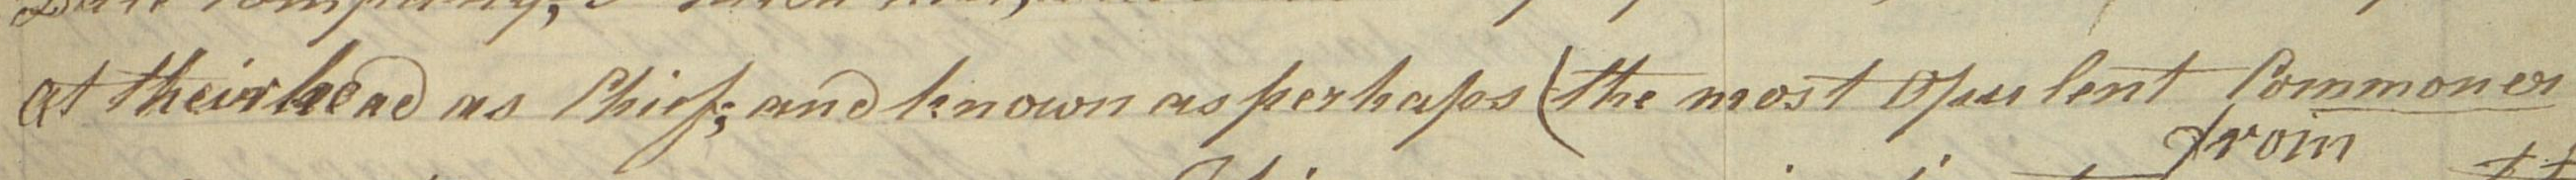at their head as Chief, and known as perhaps (the most Opulent Commoner
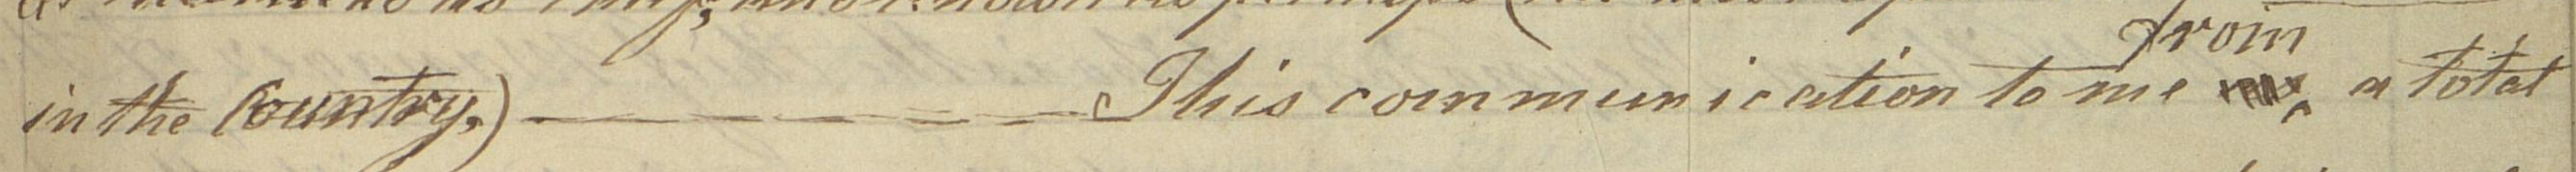in the Country.) This communication to me ^ a total
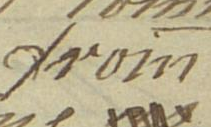from
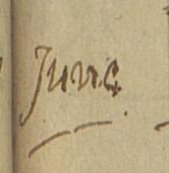June
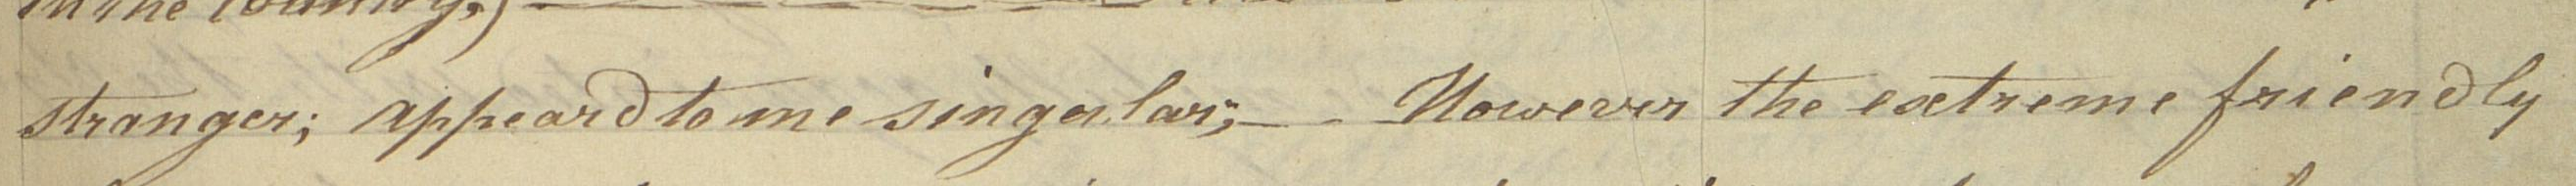stranger; appeard to me singular; However the extreme friendly
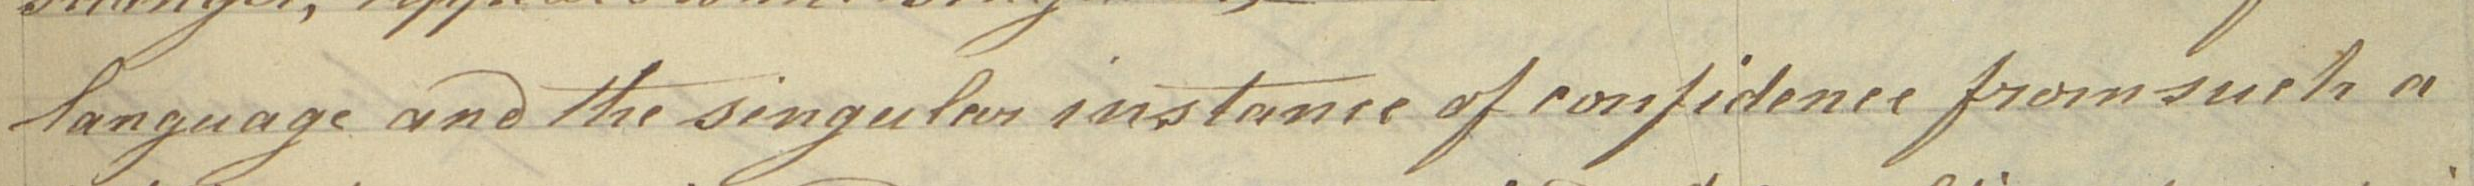language and the singular instance of confidence from such a
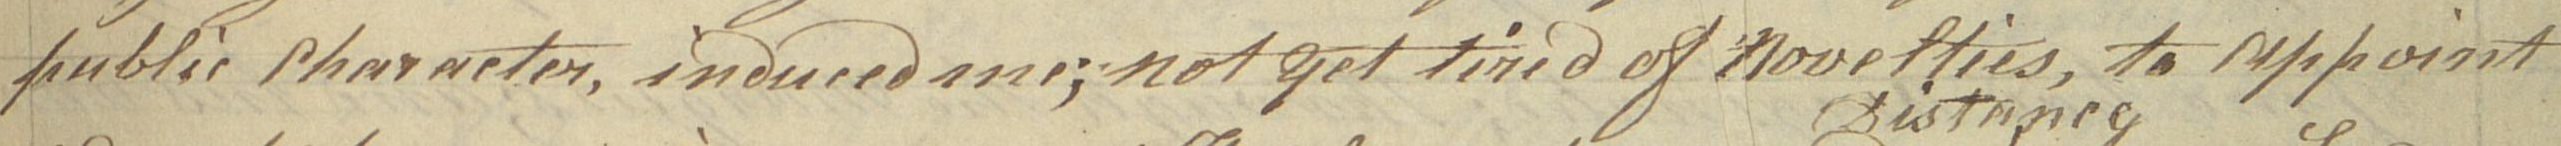public Character, induced me; not get tired of Novelties, to appoint
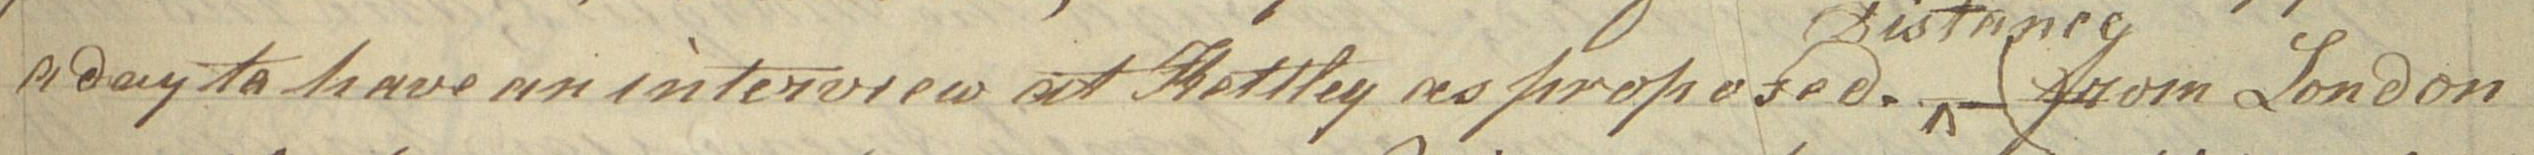a day to have an interview at Kettley as proposed. ^ (from London
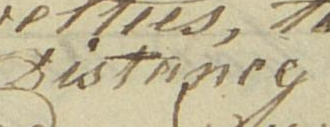Distance
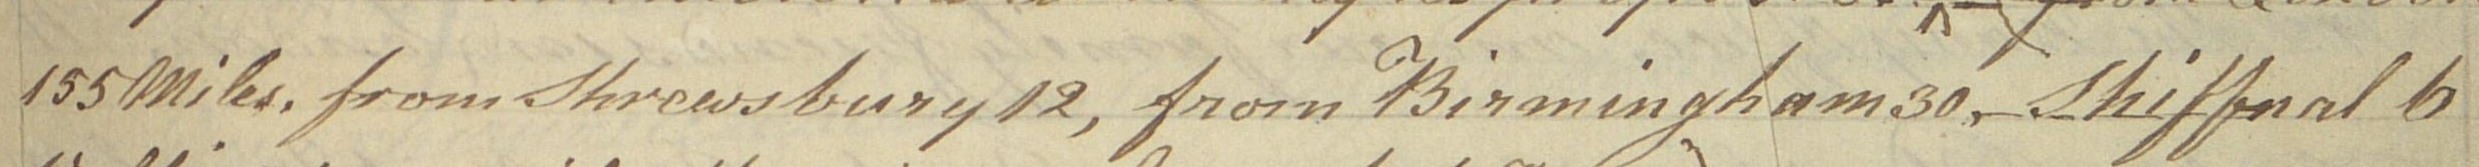155 Miles, from Shrewsbury 12, from Birmingham 30, Shiffnal 6
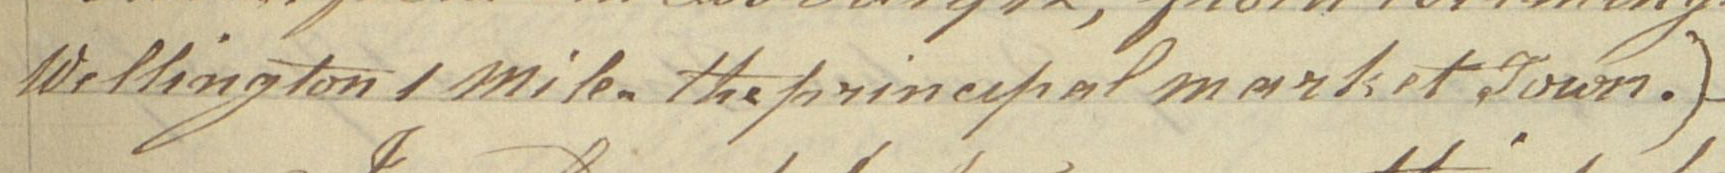Wellington 1 Mile. the principal of market Town.)
